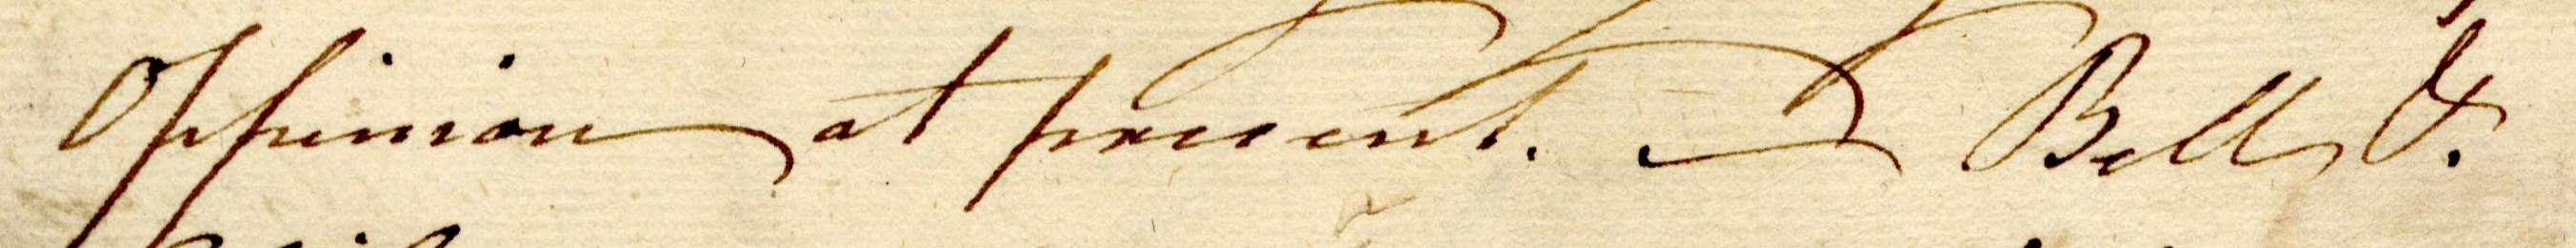Oppinion at present.- Bell &
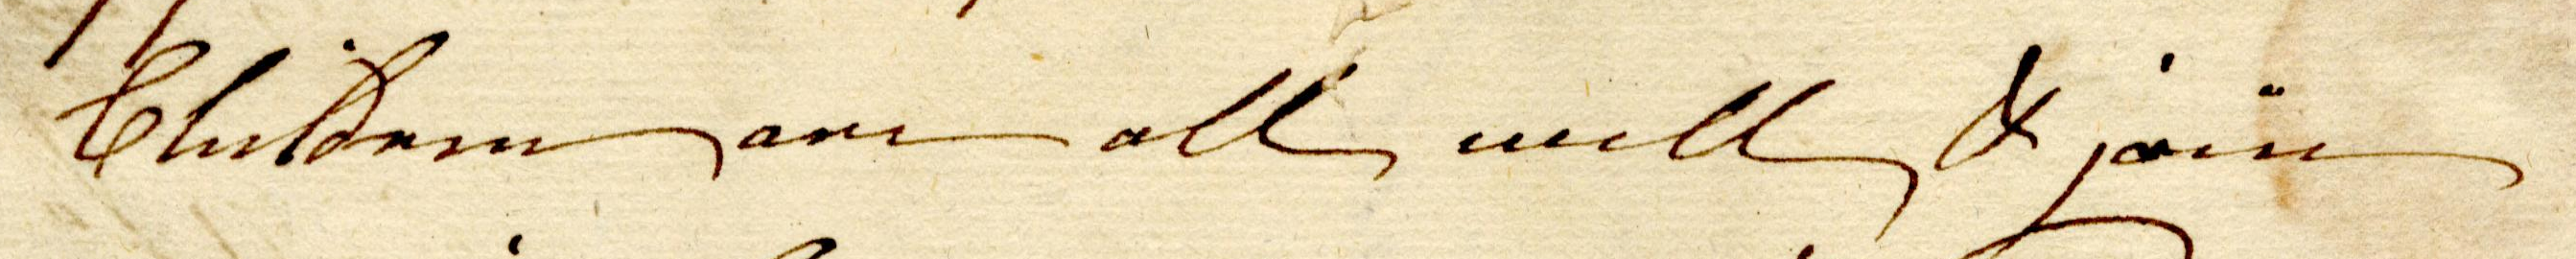Children are all well & join
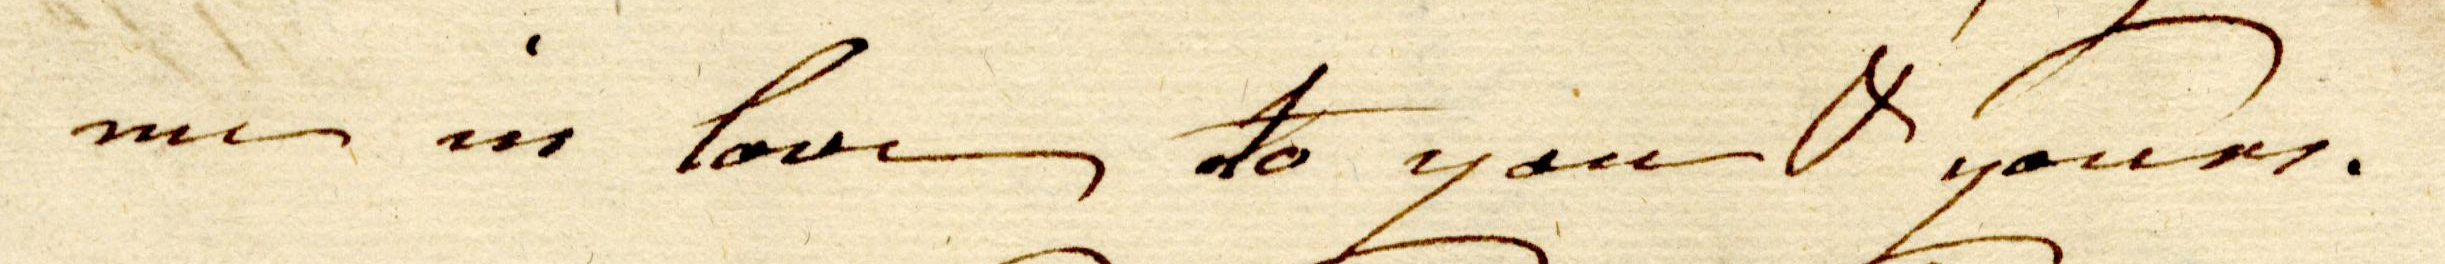me in love to you & yours.
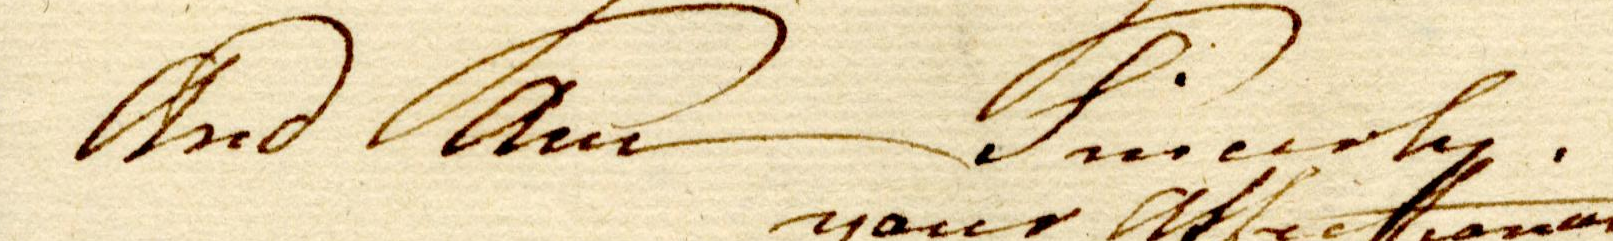And Are Sincerly
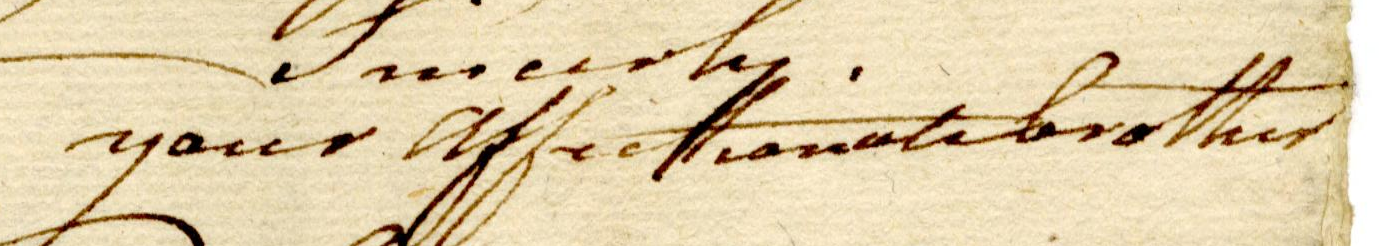your Affictionate brother
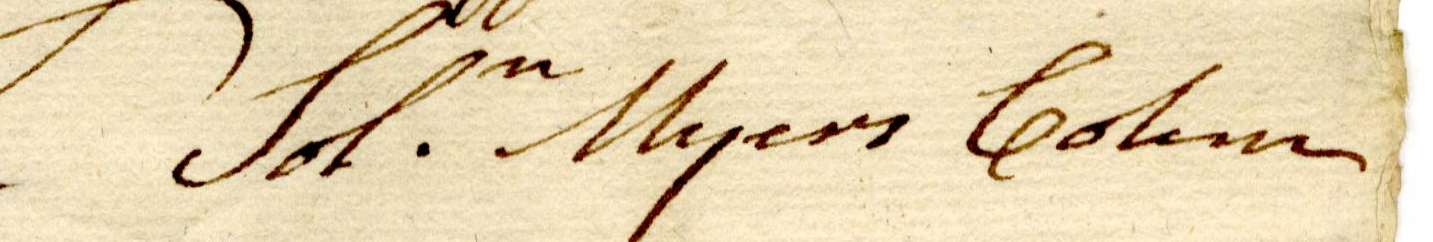Sol^n Myers Cohen
